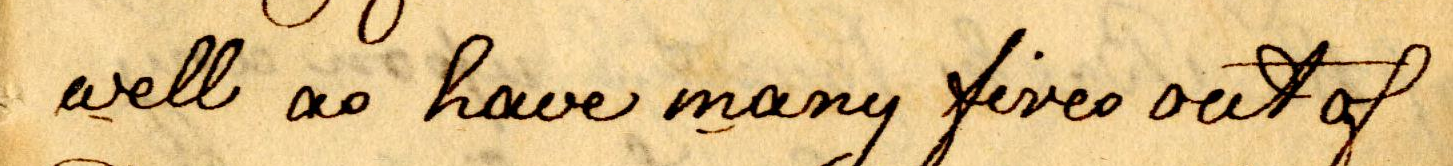well as have many fires out of
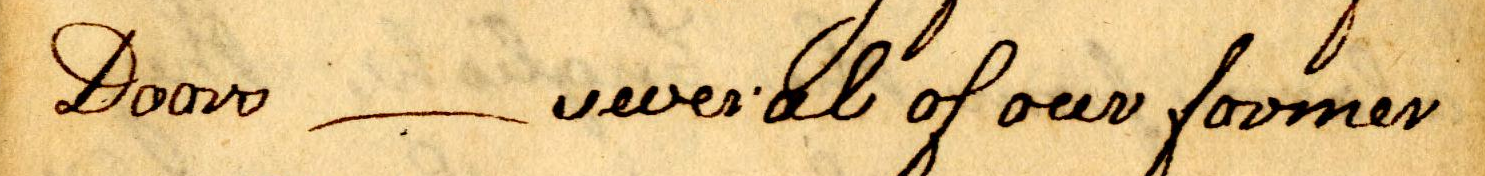Doors- several of our former
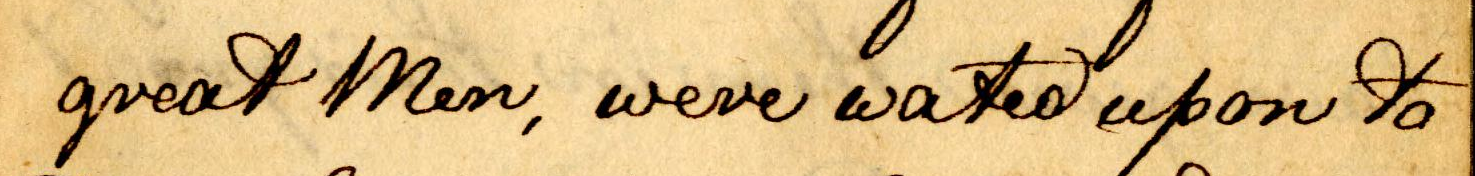great Men, were wated upon to
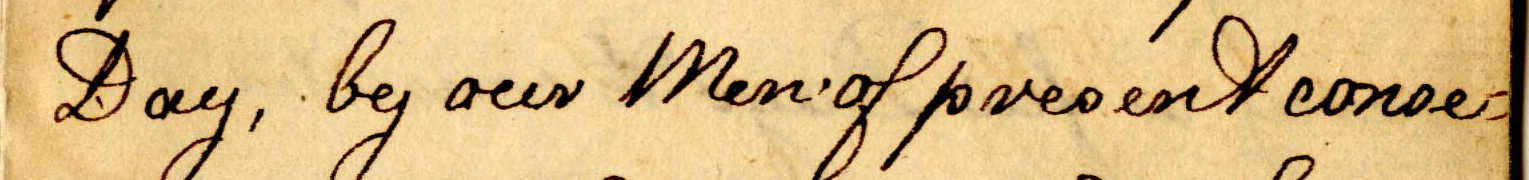Day, by our Men of present conse-
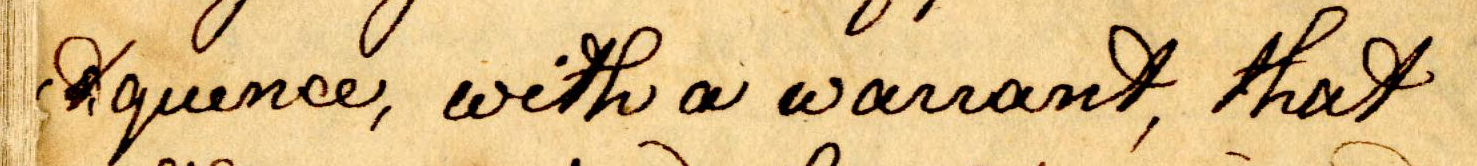-quence, with a warrant, that
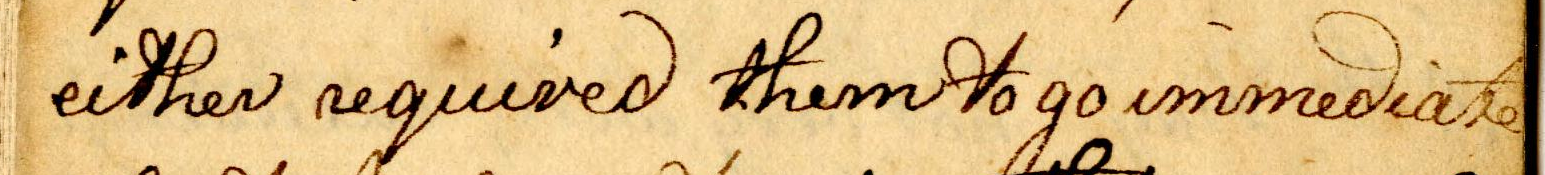either required them to go immediate
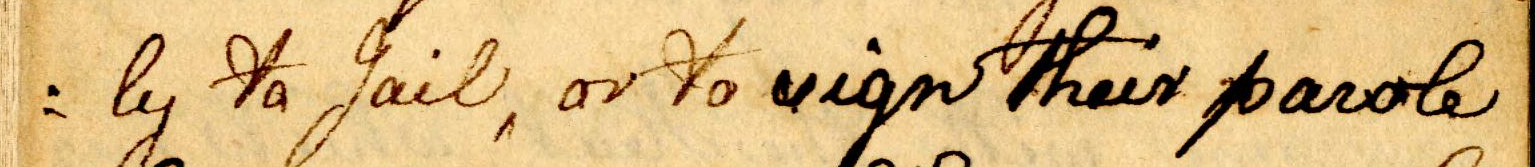-ly to Jail, or to sign their parole
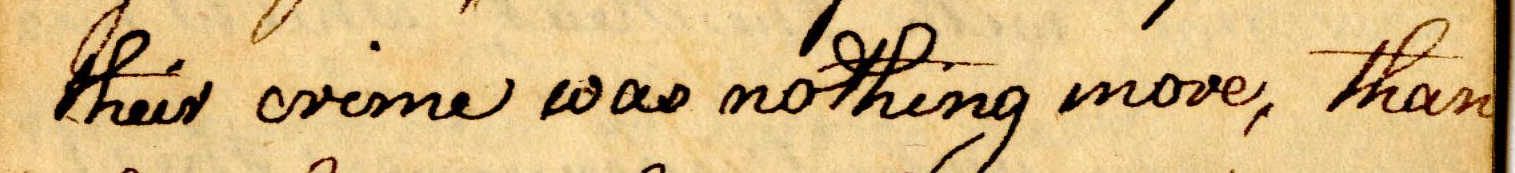their crime was nothing more, than
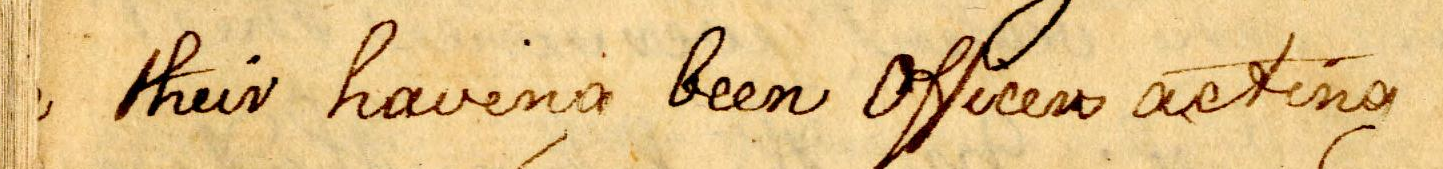their having been Officers acting
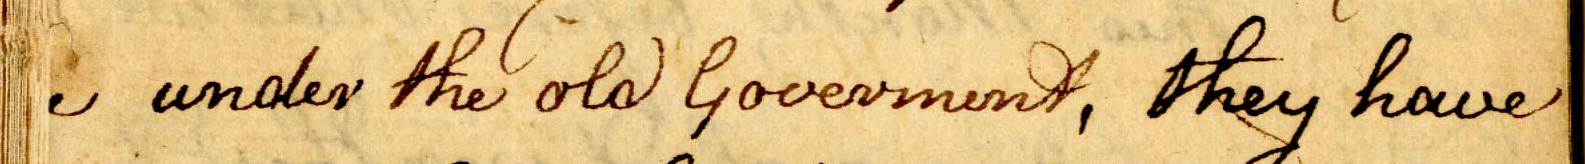under the old Government, they have
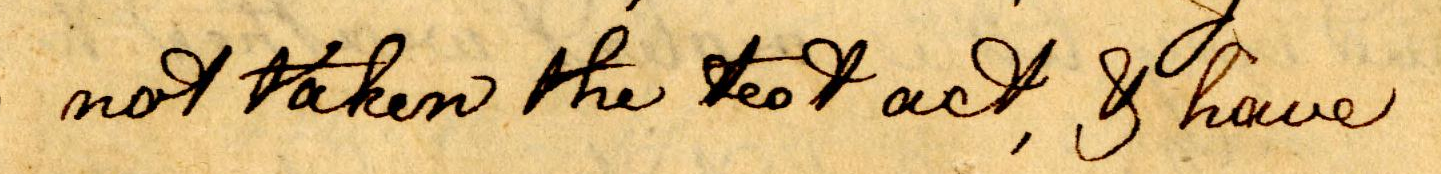not taken the test act, & have
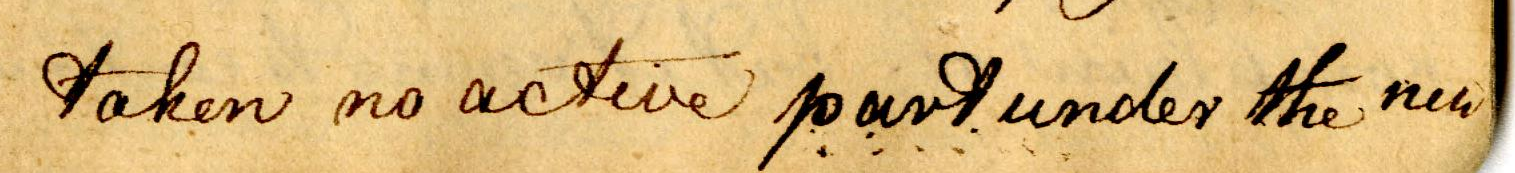taken no active part under the new
